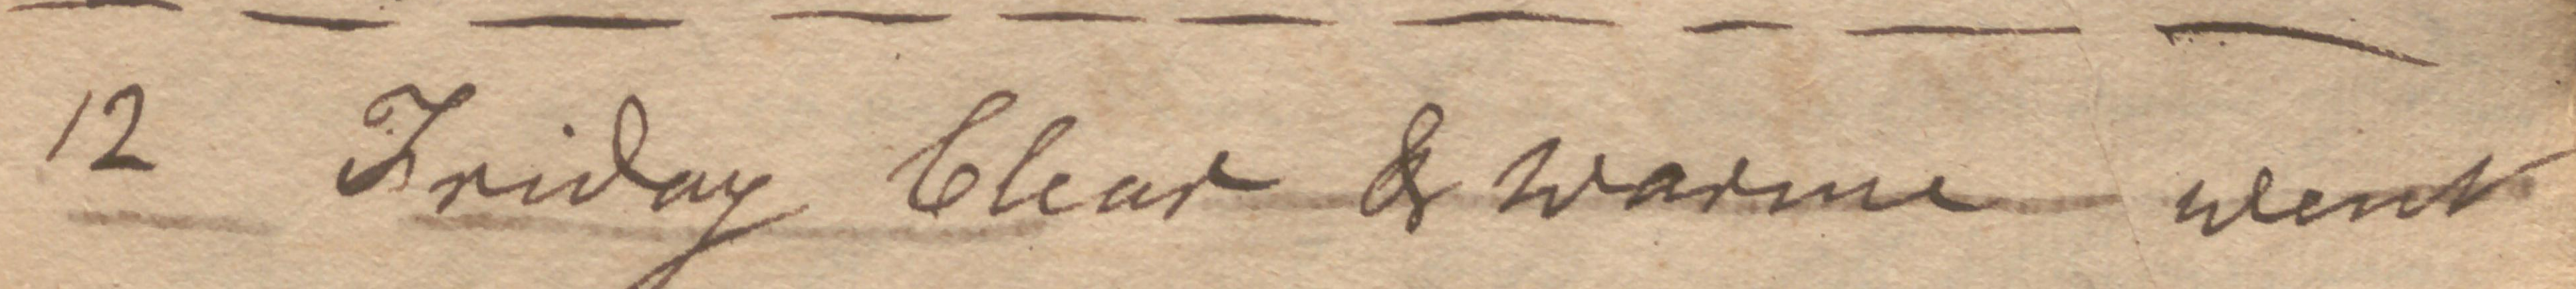12 Friday. Clear & warme went
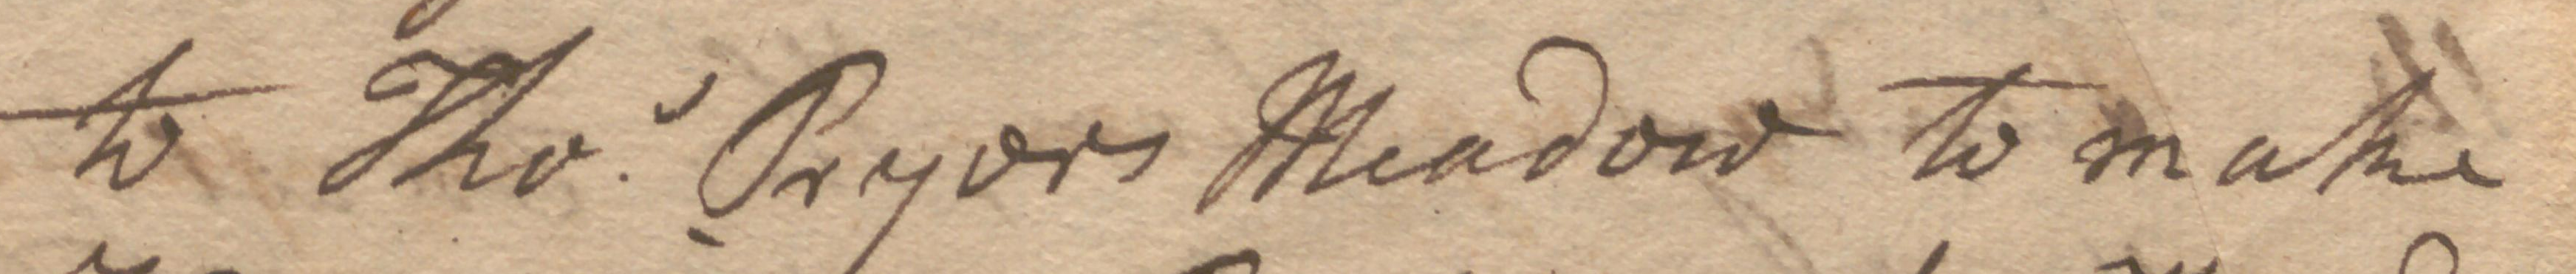to Tho^s. Pryors Meadow to make
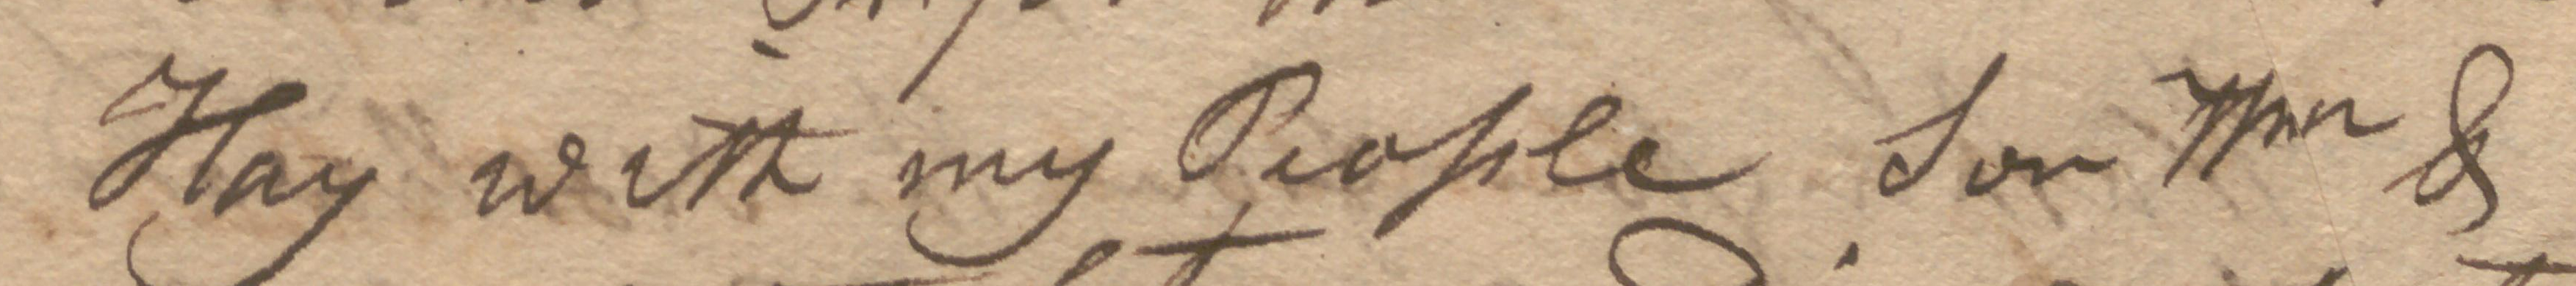Hay with my people son W^m &
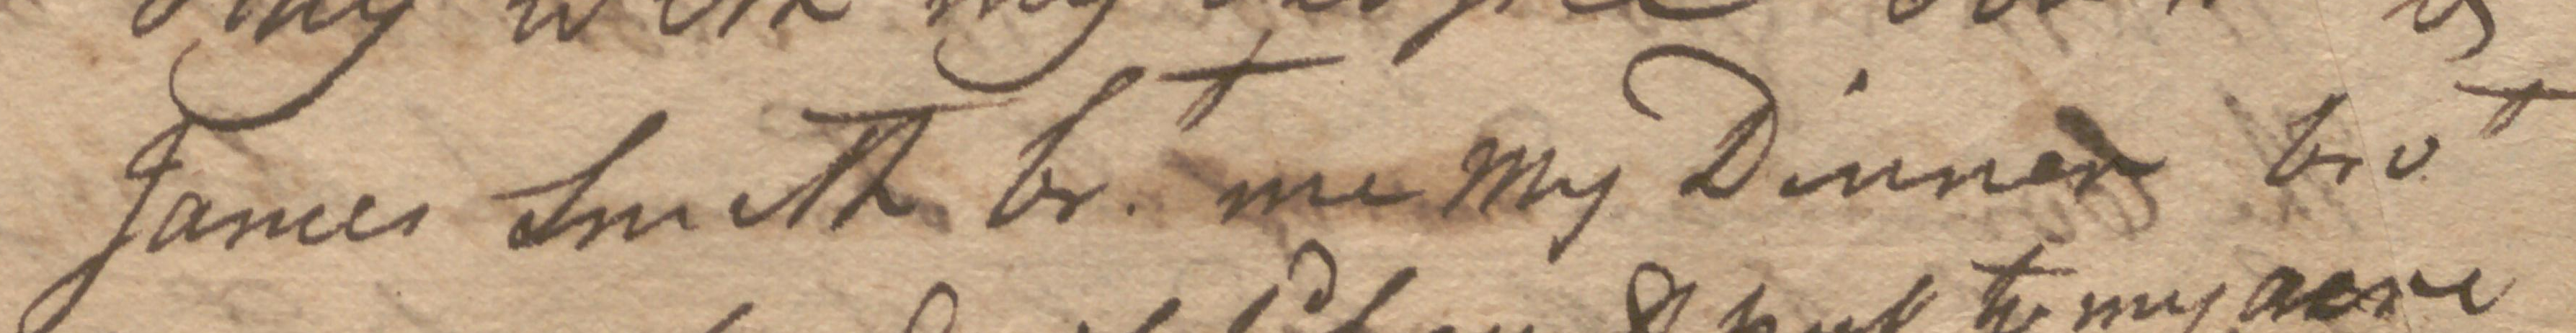James Smith br^t. me My Dinner bro^t
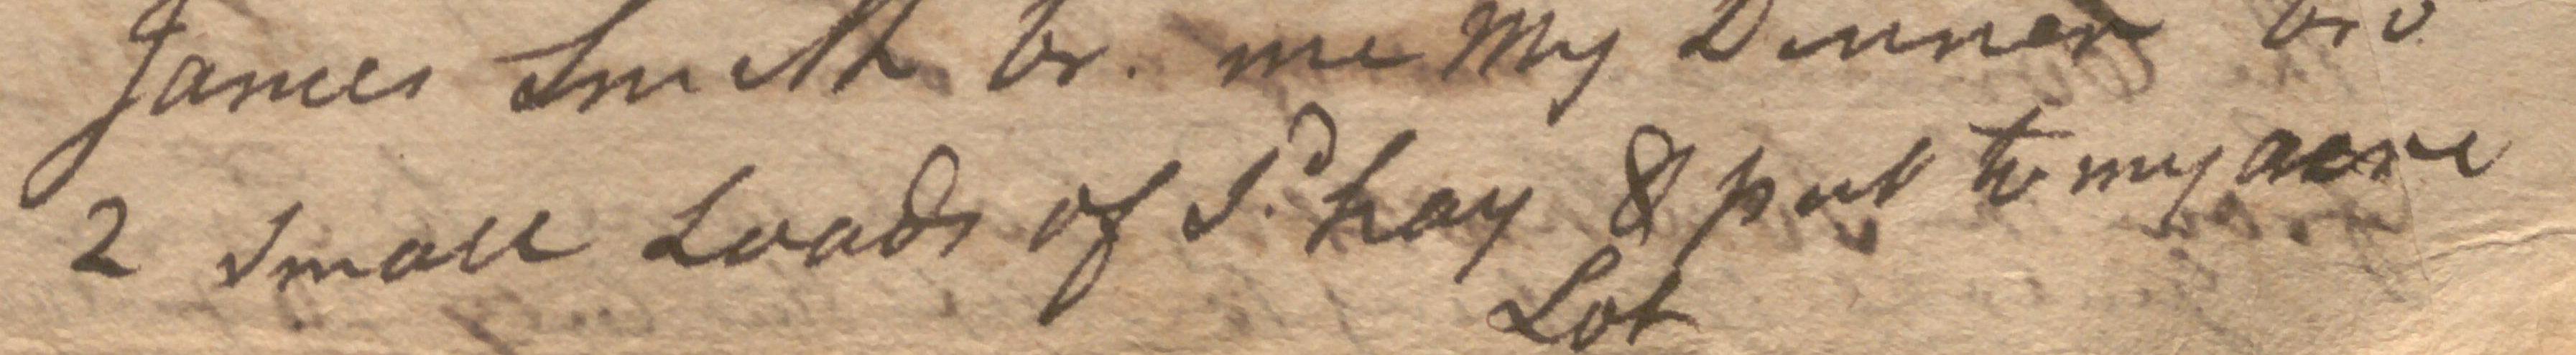2 small Loads of s^d. hay & put to my acre
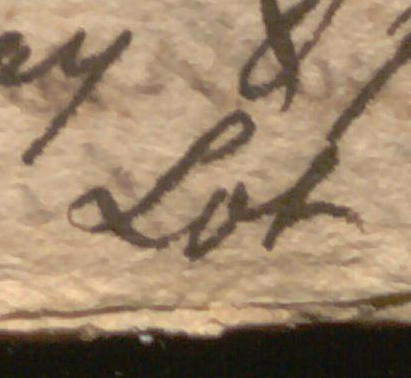Lot
